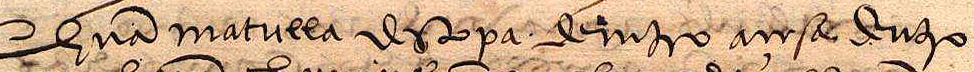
e huā matulla destopa demtro acesa dentro
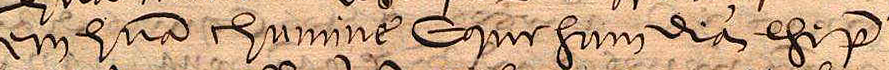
em huā chamine E que hum dia lhe p̄
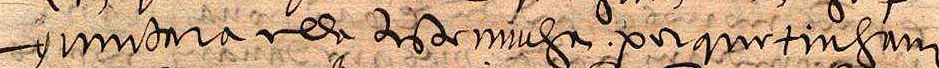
gumtara ella testemunha porque tinham
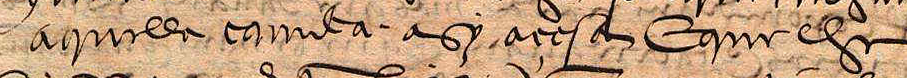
aquella camdea asy acesa E que lhe
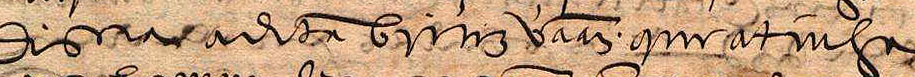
disera a dita britiz vāaz. que a tinha
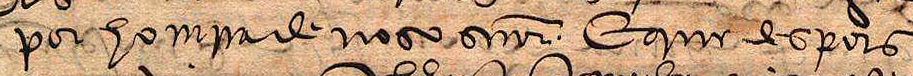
por homrra de noso snōr. E que despois
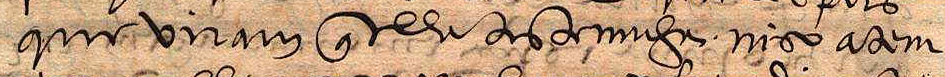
que viram q̄ ella testemunha niso atem
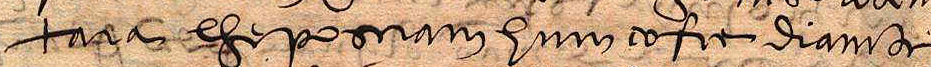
tara lhe poseram hum cofre diamte
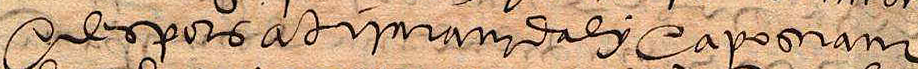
e despois a tiraram daly e a poseram
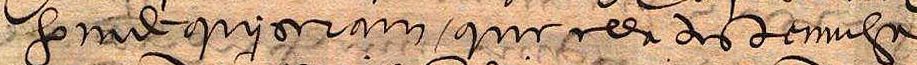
homde qujseram / que ella testemunha
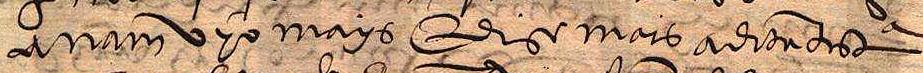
a nam vyo mays E dise mais a dita testa
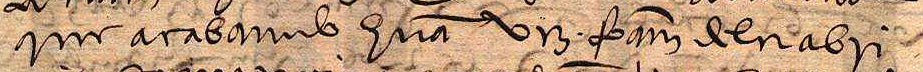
que acabamdo hūa vez foam de ler a bri
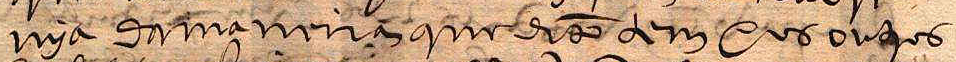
uya da maneira que dit̄o tem e os outros
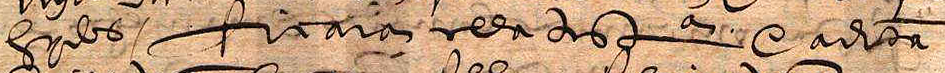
hydos / ficara ella testa e a dita
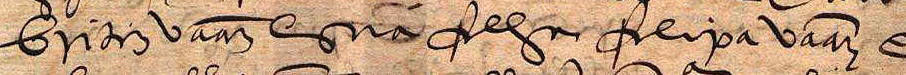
britiz vāaz e sua filha felipa vāaz e
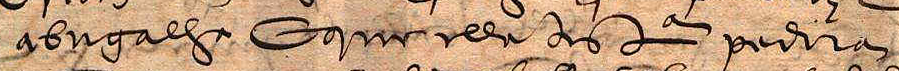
a bugalha E que ella testa pedira
